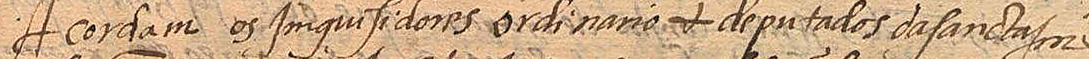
Acordam os Jmquisidores ordinario & deputados da sancta Jm
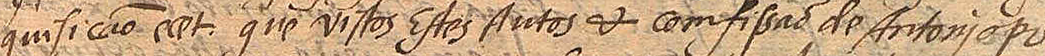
quisição ecet. que vistos Estes Autos & comfissão de Antonjo pi
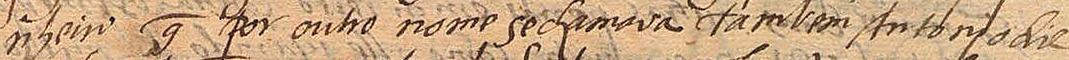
nheiro q̄ por outro nome se chamava tambem Antonjo die
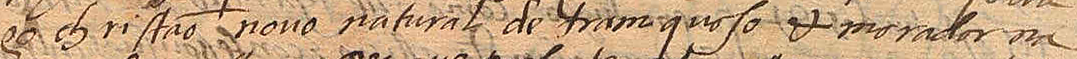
go christão novo natural de tramquoso & morador na
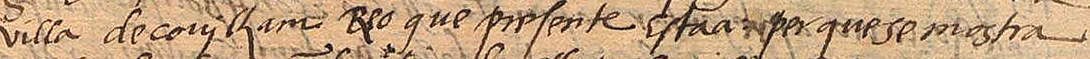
villa de coujlham Reo que presente Estaa: per que se mostra
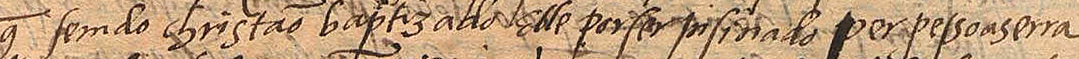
q̄ semdo christão baptizado Elle por ser jnsinado per pessoas erra
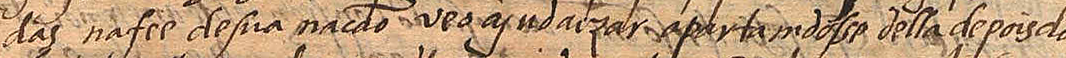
das na fee de sua nacão veo a judaizar apartamdosse della depois do
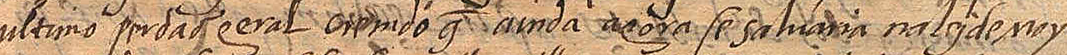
ultimo perdão geraL cremdo q̄ ainda agora se saluaria na Lej de moy
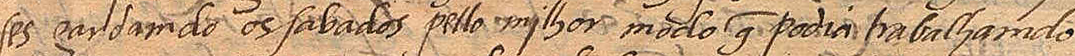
ses gardamdo os sabados pello mjlhor modo q̄ podia trabalhamdo
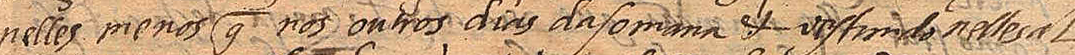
nelles menos q̄ nos outros dias da somana & vestimdo nelles aL
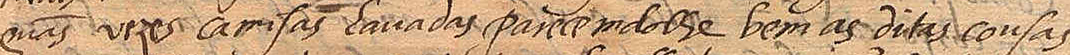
gūas vezes camisas lauadas parecemdolhe bem as ditas cousas
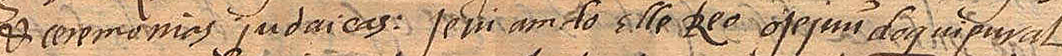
& ceremonias judaicas: jeiuamdo Elle Reo o jejuū do quipur aL
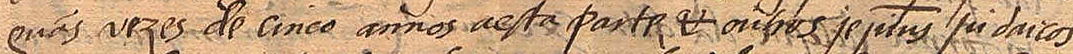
guās vezes de cinco annos a esta parte & outros jejuūs judaicos
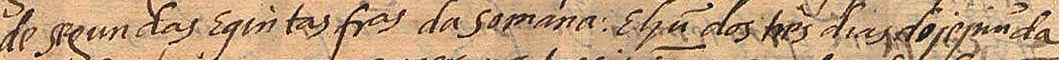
de segundas E qintas fras da somana: E hū dos tres dias do jejuū da
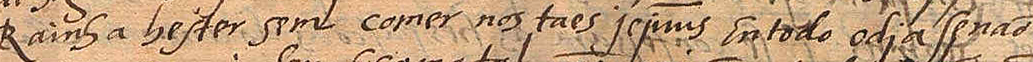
Rainha hester sem comer nos taes jejuūs En todo o dja senaõ
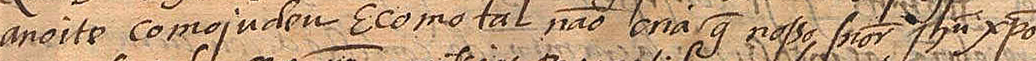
a noite como judeu E como tal não cria q̄ nosso snōr Jhū xp̄o
